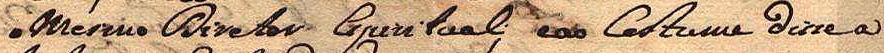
o Mesmo Diretor Esperitual; e ao Costume disse a
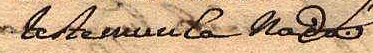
testemunha Nada.
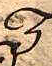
3
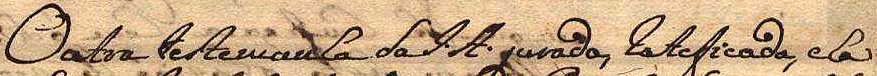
Outra testemunha da I. A. jurada, Rateficada, e ha
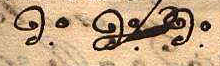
d.o d.o d.o
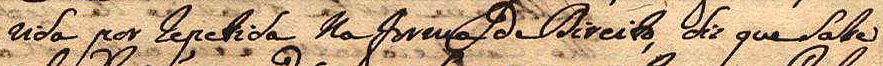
vida por Repetida Na forma de Direito, diz que sabe
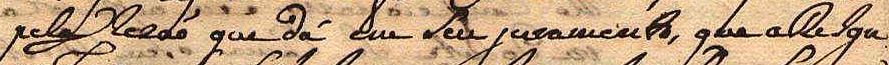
pela Rezaõ que dá em seu juramento, que a Re Ign
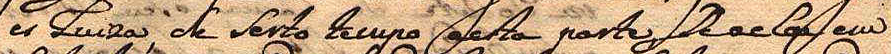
es Luiza, de serto tempo a esta parte se achou em
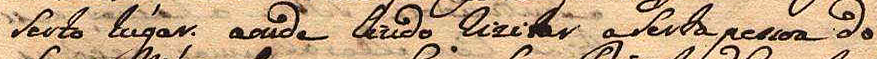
serto lugar; aonde hindo Vizitar a serta pessoa do
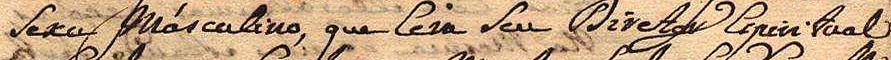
sexu Masculino, que hera seu Diretor Espiritual
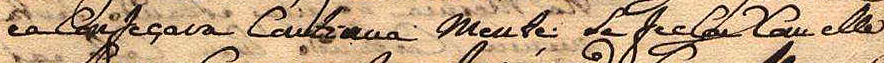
e a Confeçava Continuamente; se fechou Com elle
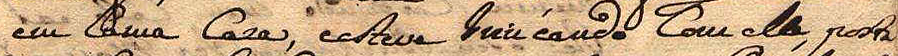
em huma Caza, e esteve brincando Com elle, posta
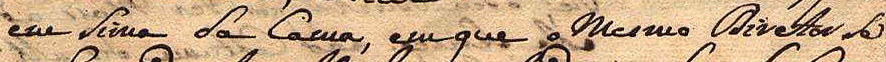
em Sima da Cama, em que o Mesmo Diretor se
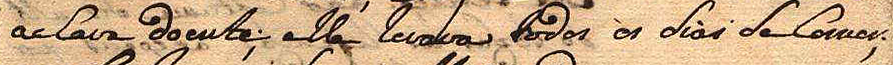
achava doente; ella Rezava todos os dias de Comer;
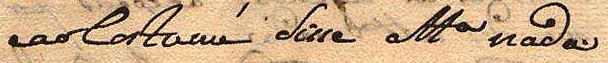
e ao Costume disse a tta nada.
